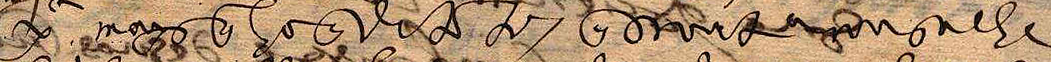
pa mays q̄ ho q̄ dito tē / q̄ se outa cousa lhe
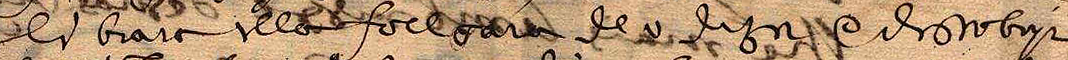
lēbrara ella follgara de o dizer e descobryr
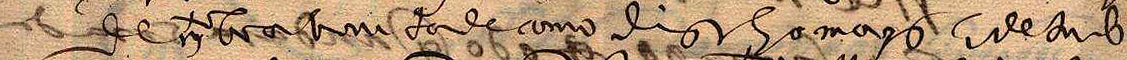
de mto boa vomtade como dise ho mays E de tudo
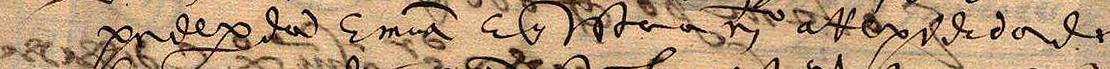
pede ꝑdā E miā E q̄ estaa mto aRepēdida de
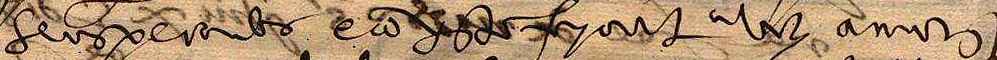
seos pecados e cō ysto foy outa vez amoes
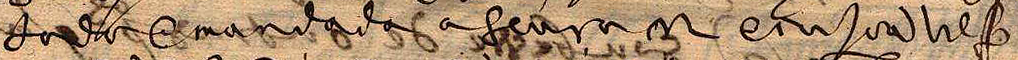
tada e mandada a seu cacer e eu Joā velho
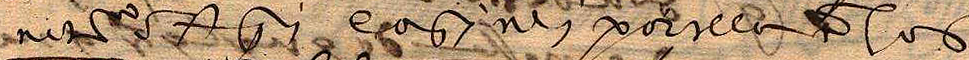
notro o stp̄vi e asjnej por ella cō os
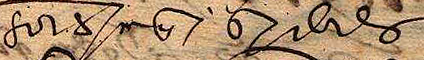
sōrs Jmqjsjdores
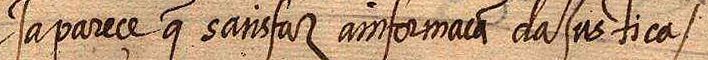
Ja pareçe q̄ satisfaz a informacā da Justica /
